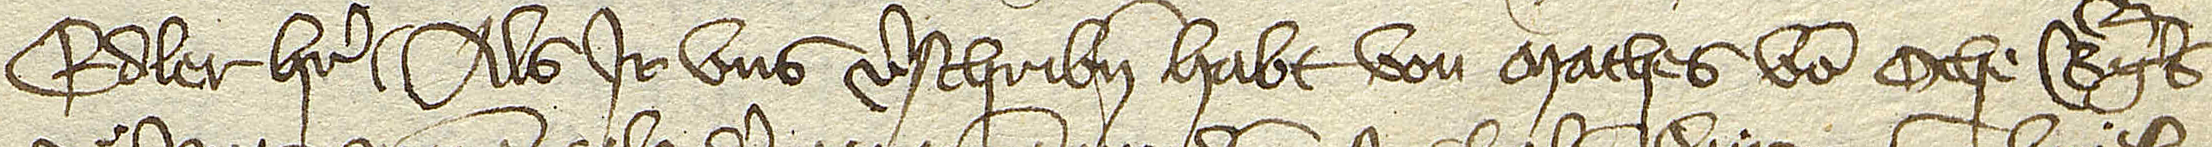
Edler hr* / Als Ir vns v*ſchribn* habt von Mathes vo* Oche B*g*s
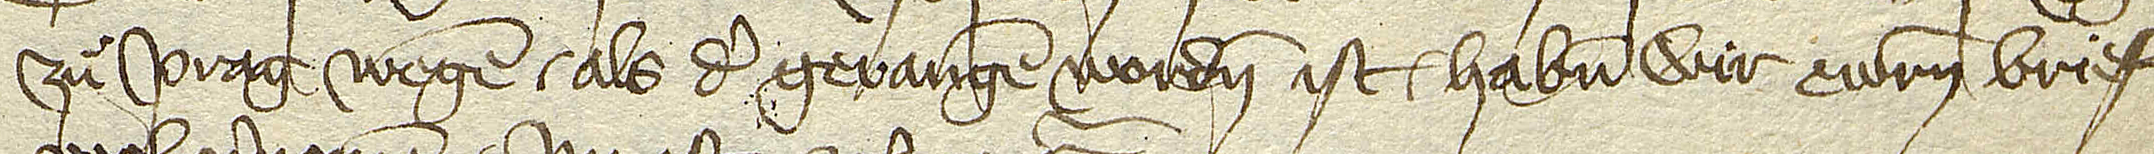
cʒü Prag wege* / als d* gevange* wordn* iſt / habn* wir ew*rn brief
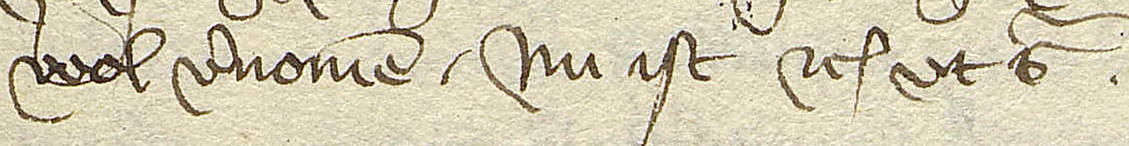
wol v*nome* / Nu iſt ec* vt* s* .
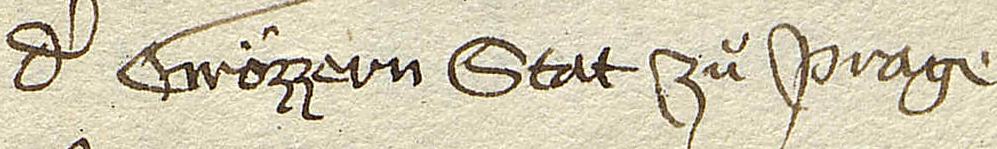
D* Gröʒʒern Stat cʒü Prage
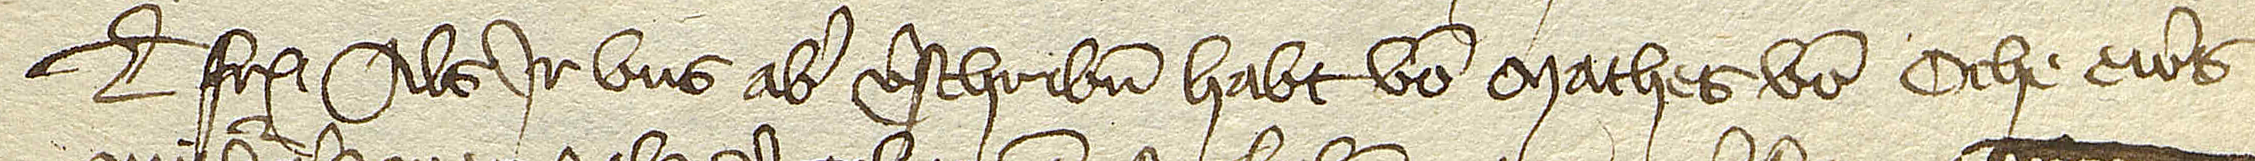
L* fr* / Als Ir vns ab* v*ſchribn* habt vo* Mathes vo* Oche ew*rs
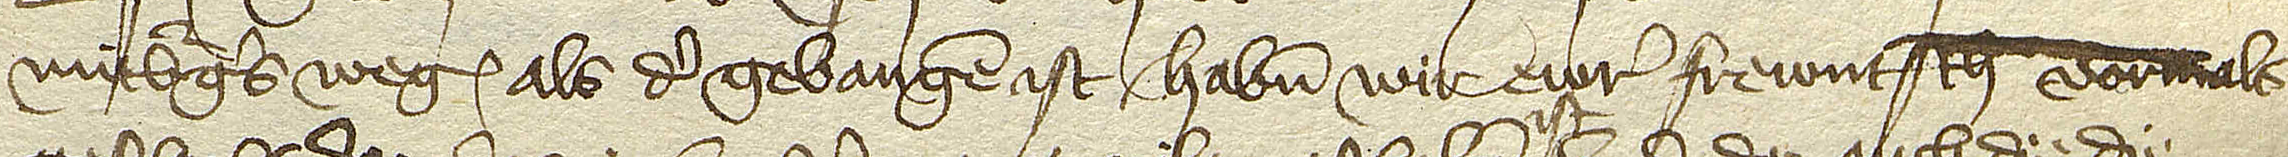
mitb*g*s weg* als d* gevange* iſt / habn* ewr* frewntſch* vormals
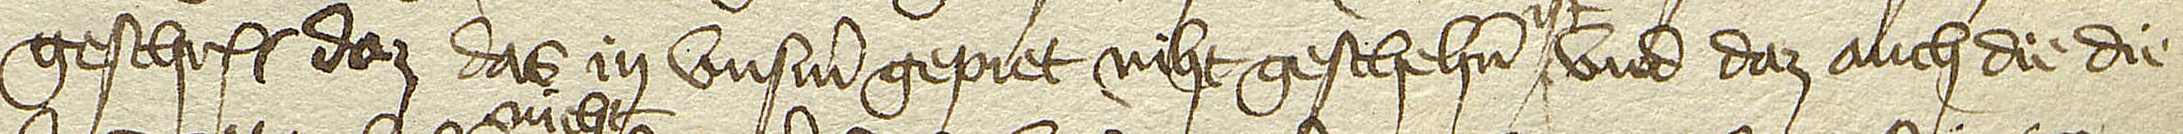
geſchr* / daʒ das in vnſm* gepiet niht geſchehn* vnd daʒ auch die die
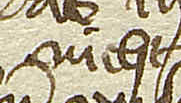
nicht
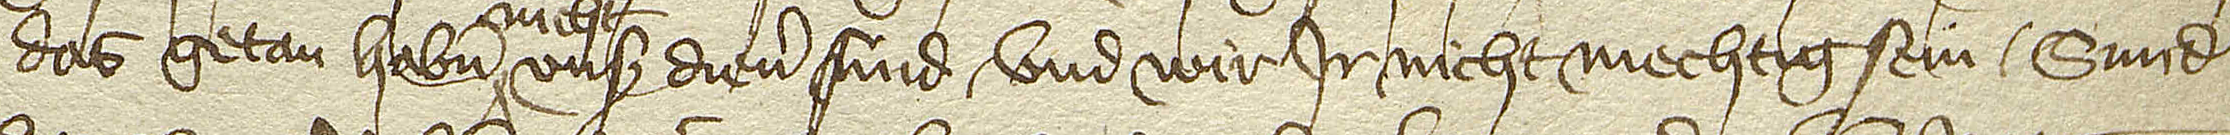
das getan habn* vnſ* dien* ſind / vnd wir Ir nicht mechtig ſein / Sund*
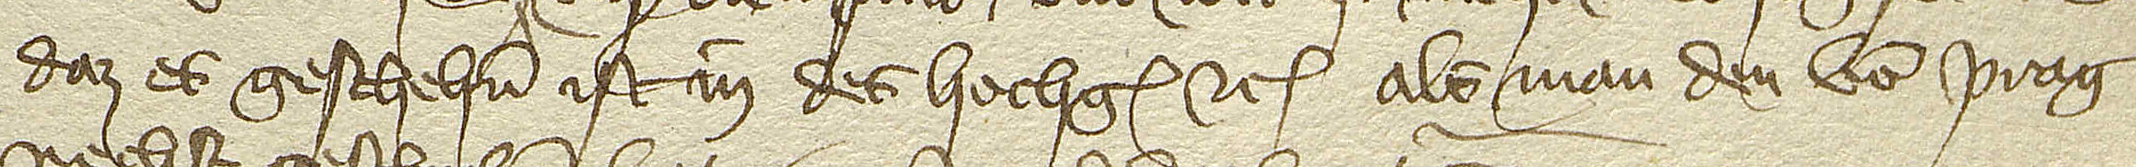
daʒ es geſchehn* iſt in des hochg* ec* als man den vo* Prag
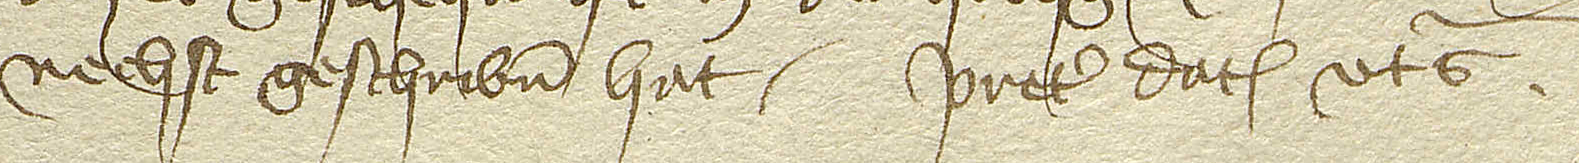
nehſt geſchribn*n hat / Pret* dat* vt s* .
